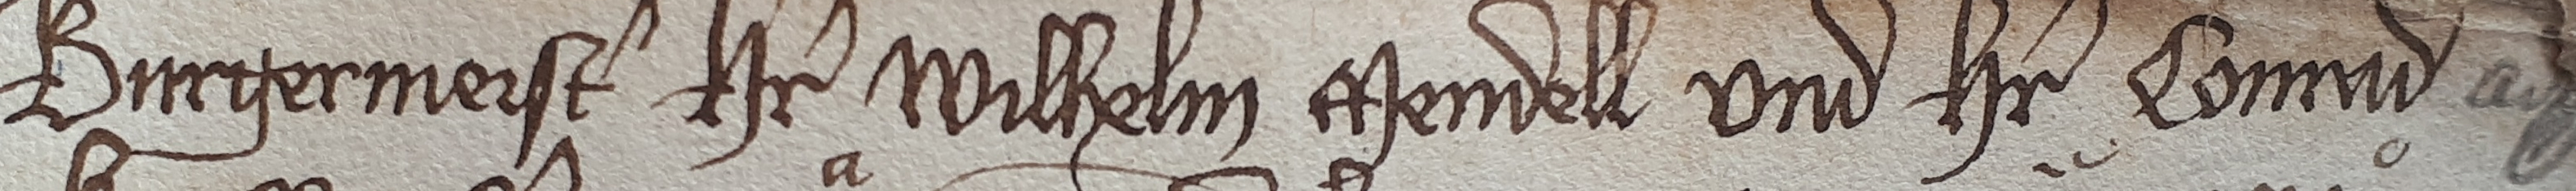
Burgermeiſt* Hr* Wilhelm Mendell vnd hr* Conrad
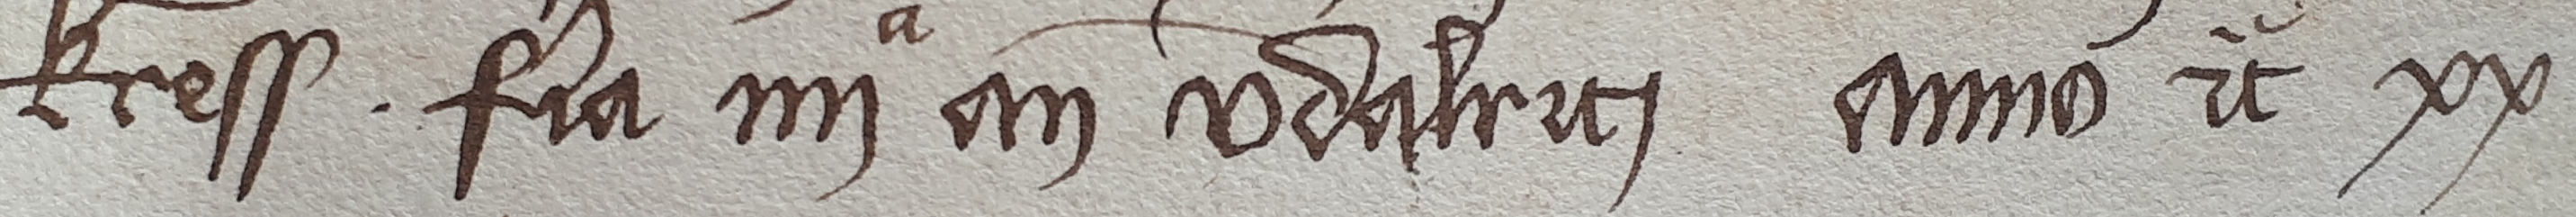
Kreſſ . f*ia iiii* an* vdalrici anno ec* xx*
